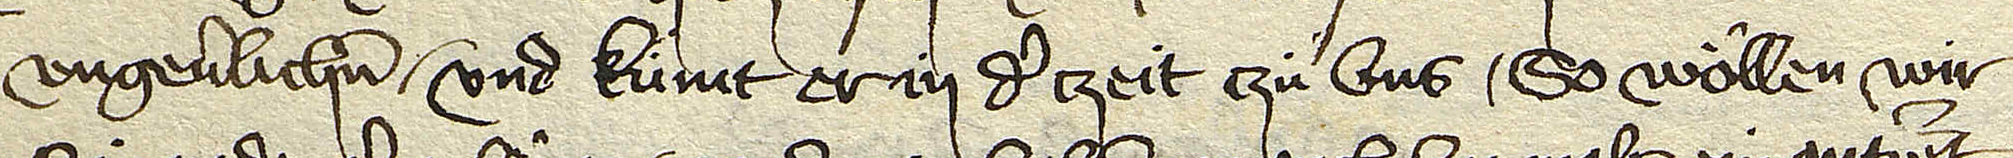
vngeu*lichn* / vnd kümt er in d* cʒeit cʒü vns / So wöllen wir
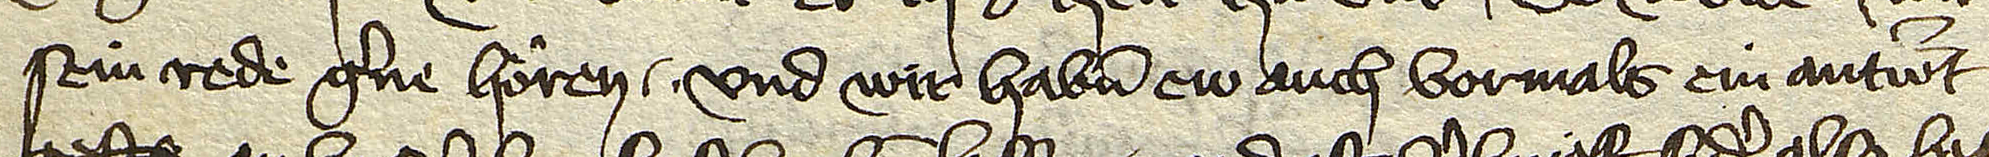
ſein rede g*ne hören / . vnd wir habn* ew auch vormals ein antw*t
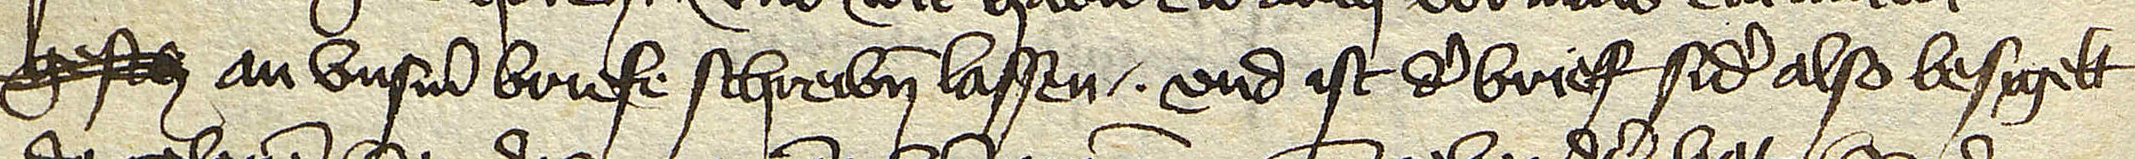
geſch an vnſm* briefe ſchreibn* laſſen / . vnd iſt d* brief ſid* alſo beſigelt
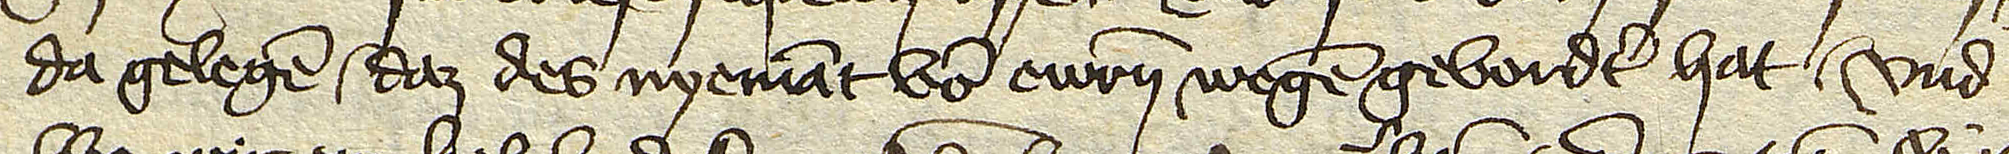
da gelege* / daʒ des nyemat* vo* ewrn* wege* gevordt* hat / vnd
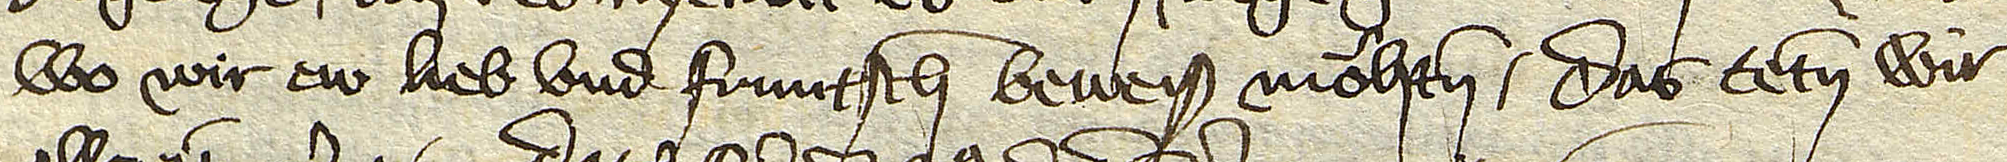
wo wir ew lieb vnd fruntſch* beweiſ* möhtn* / Das tetn* wir
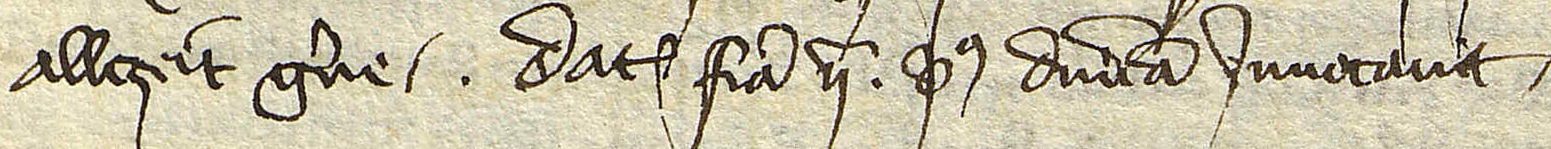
allcʒeit g*ne / . Dat* fia* ii* . p* dnica* Inuocauit /
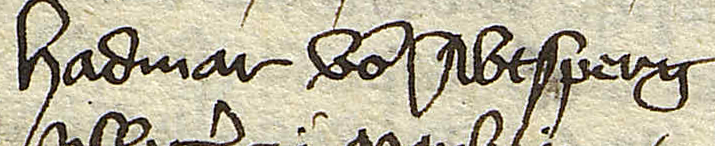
hadmar vo* Abtſperg
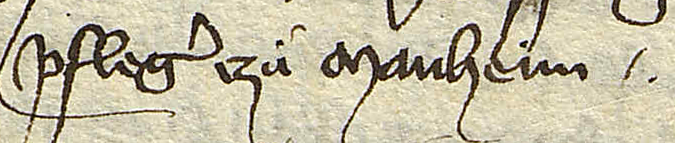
pfleg* cʒü Manheim / .
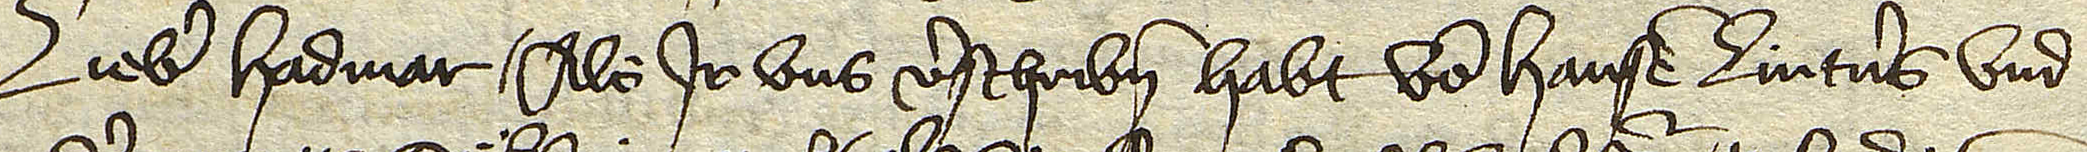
Lieb* hadmar / Als Ir vns v*ſchribn* habt vo* hanſe* Lintn*s vnd
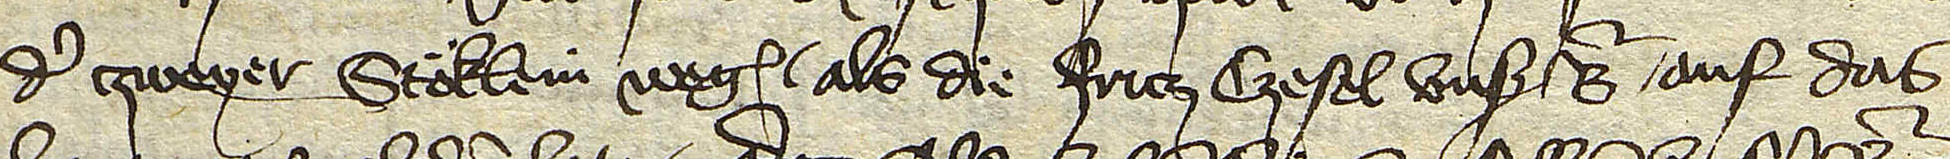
d* cʒweyer Stöklein weg* / als die Fricʒ Cʒeſel vnſ* B* / auf das
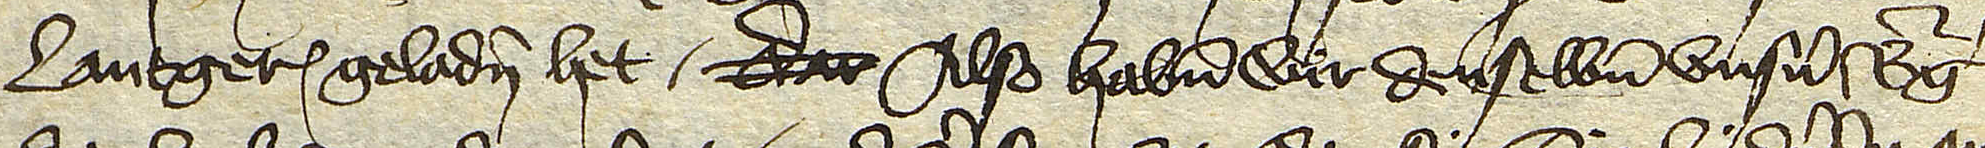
Lantger* geladn* het / Dar Alſo habn* wir denſelbn* vnſn* B*g*
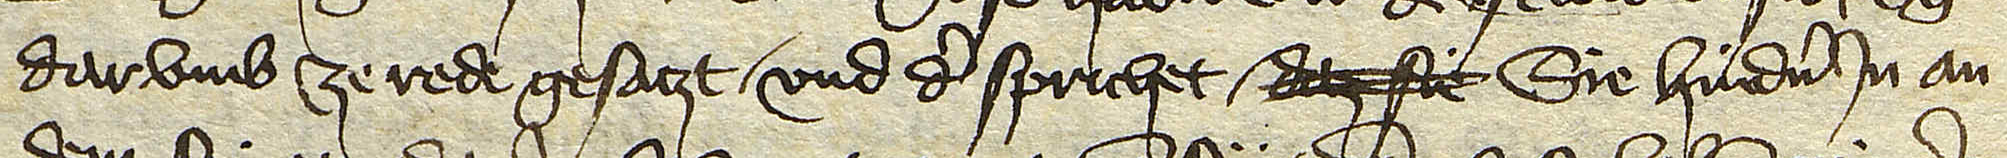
darvmb cʒerede geſacʒt / vnd d* ſprichet / daʒ ſie Sie hindn* In an
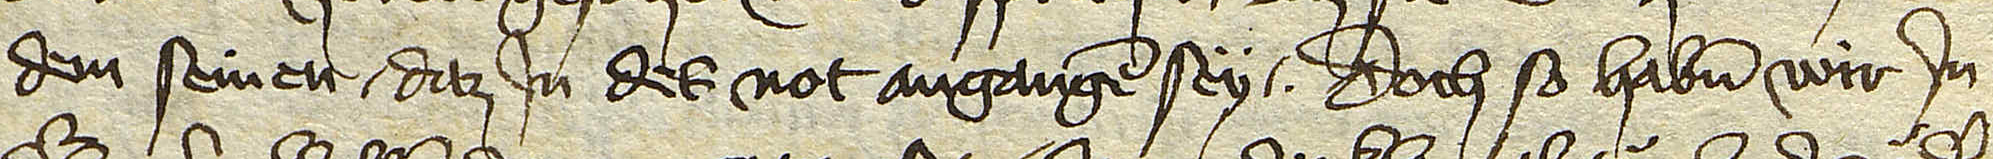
dem ſeinen / daʒ In des not angange* ſey / Doch ſo habn* wir In
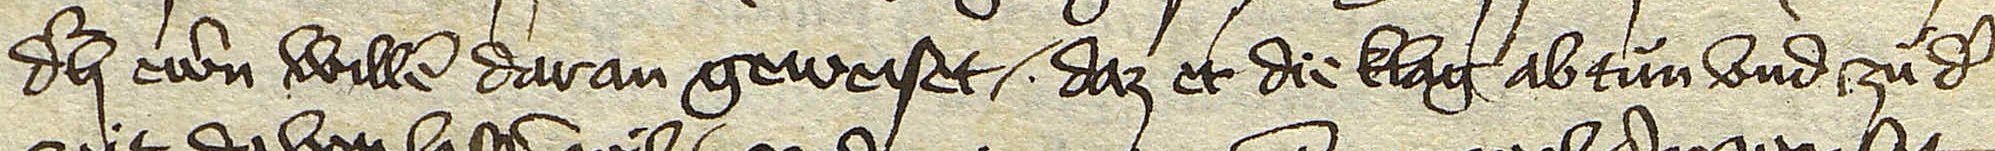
d*h ewn* wille* daran geweiſet / . daʒ er die klag ab tün vnd cʒü d*
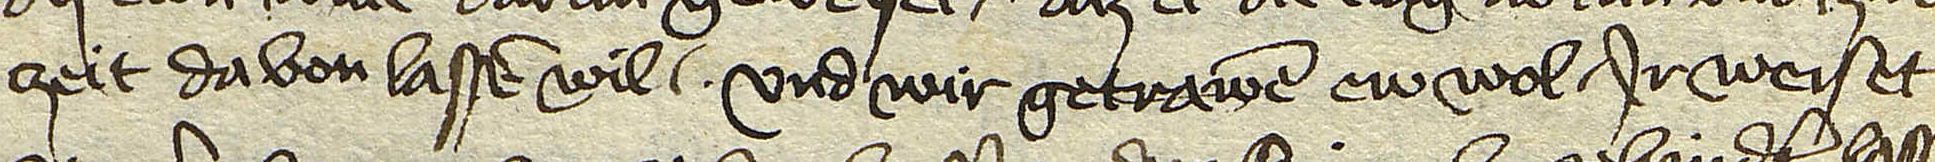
cʒeit davon laſſe* wil / . vnd wir getrawe* ew wol / Ir weiſet
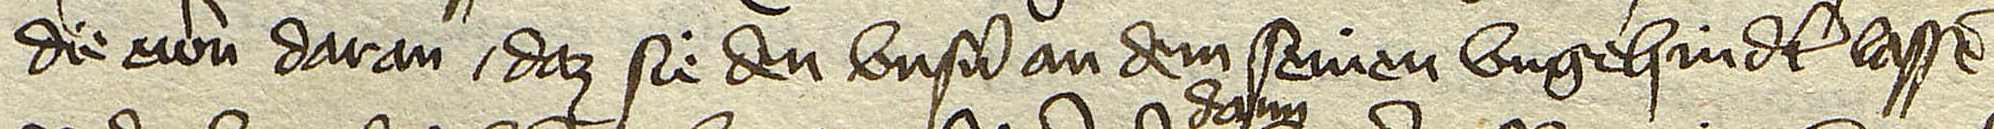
die ewn* daran / daʒ ſie den vnſn* an dem ſeinen vngehindt* laſſe*
